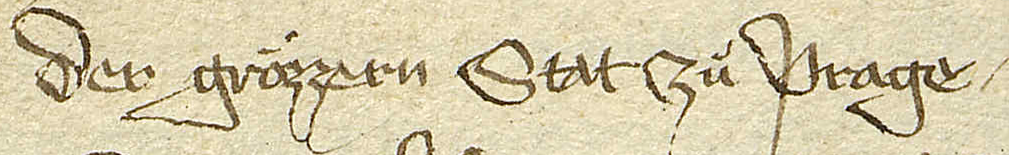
Der gröʒʒern Stat cʒü Prage /
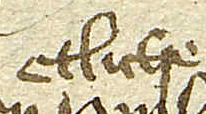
etliche
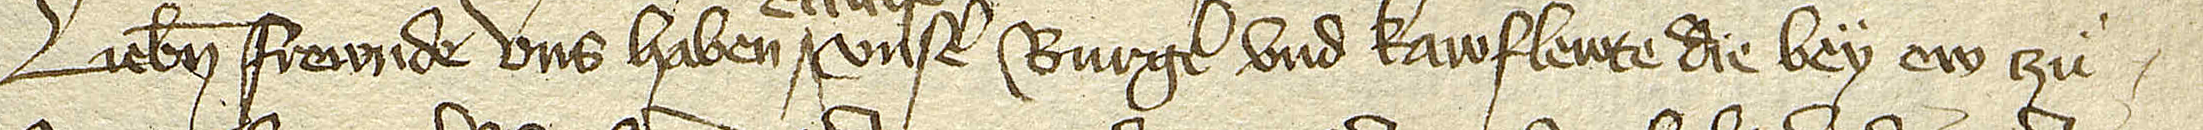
Liebn* frewnde / Vns haben vnſe* Burge* vnd kawflewte die bey ew cʒü /
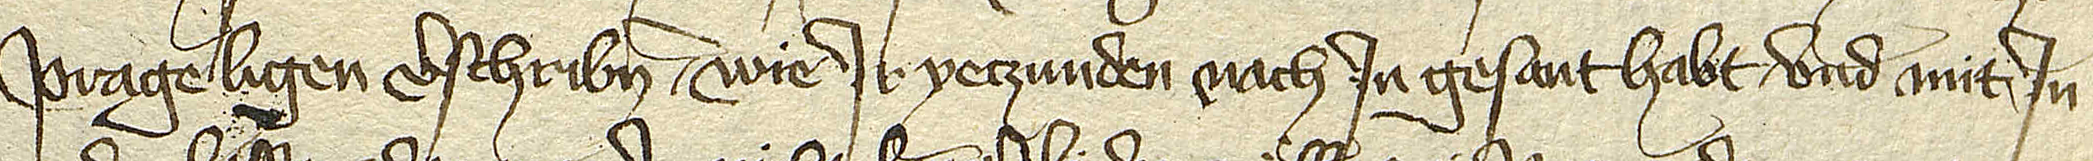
Prage ligen v*ſchribn* / wie Ir yecʒunden nach In geſant habt / vnd mit In
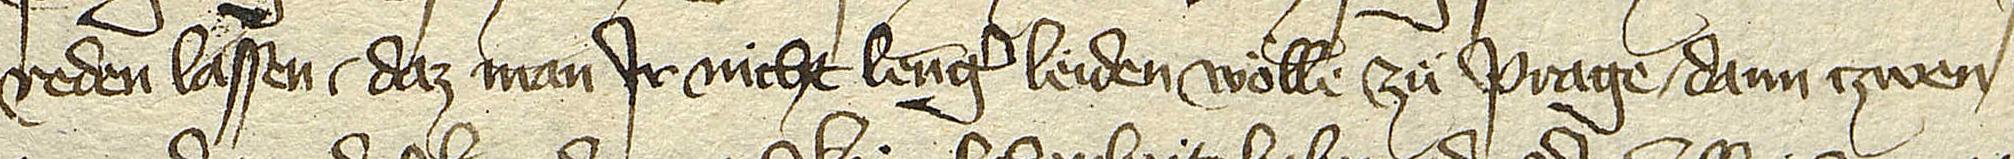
reden laſſen / daʒ man Ir nicht leng* leiden wölle cʒü Prage / dann cʒwen
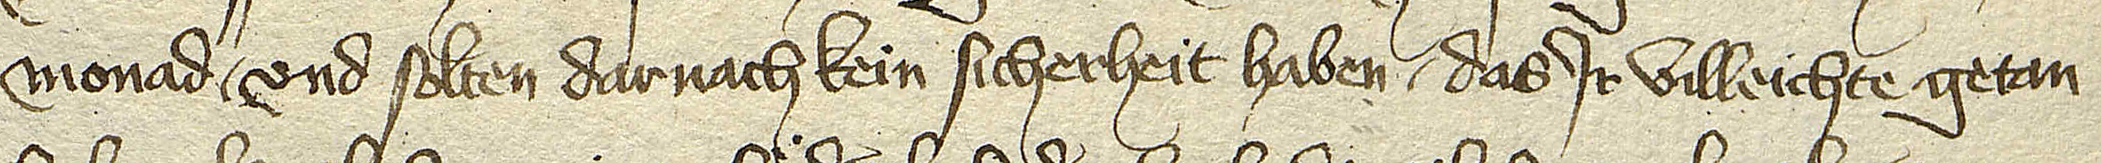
monad / vnd ſolten dar nach kein ſicherheit haben / das Ir villeichte getan
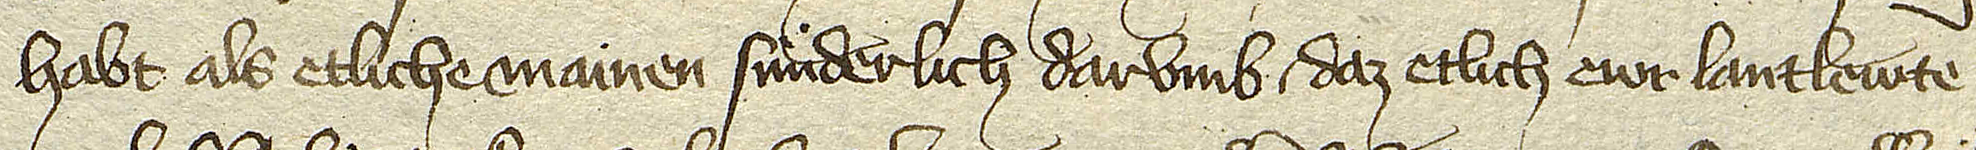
habt als etliche mainen ſünderlich darvmb / daʒ etlich ewr lantlewte
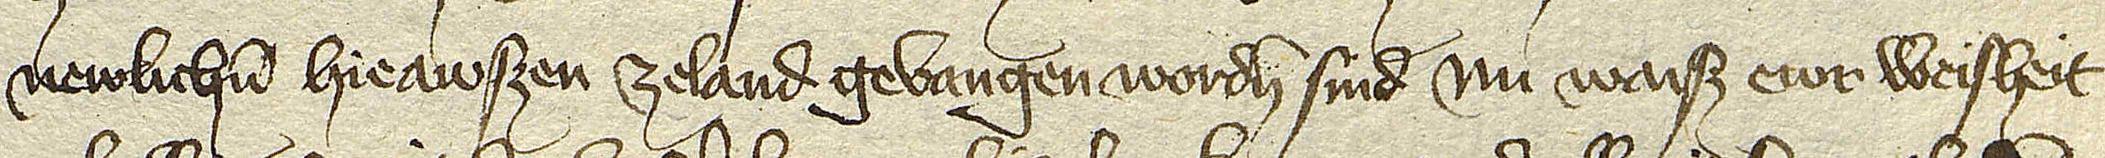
newlichn* hieauſʒen cʒeland gevangen wordn* ſind Nu waiſʒ ewr weiſheit
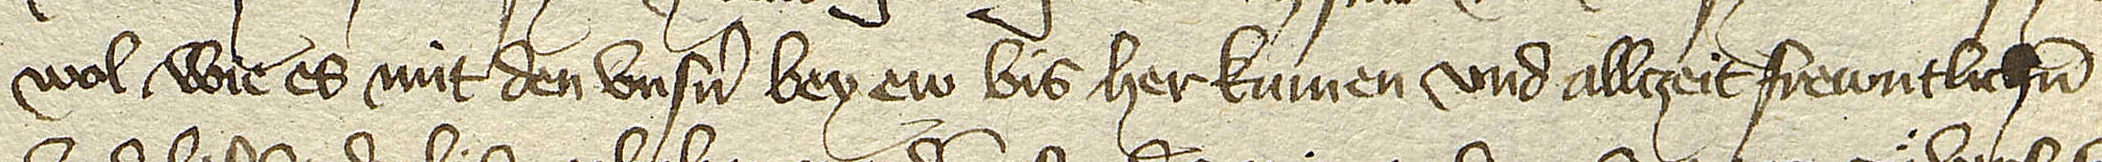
wol / wie es mit den vnſn* bey ew bis her kumen vnd allcʒeit frewntlichn*
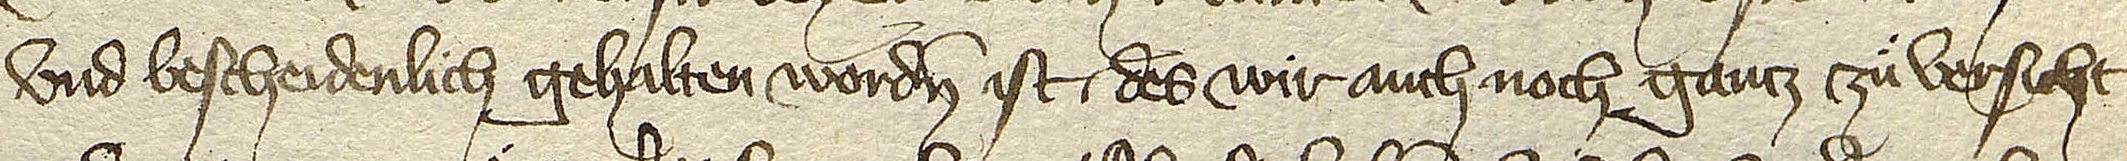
vnd beſcheidenlich gehalten wordn* iſt / des wir auch noch gancʒ cʒü verſicht
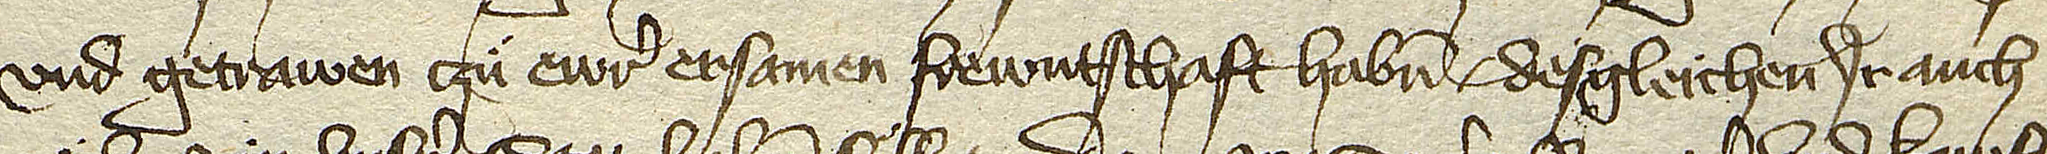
vnd getrawen cʒü ewr* erſamen frewntſchaft habn* / deſgleichen Ir auch
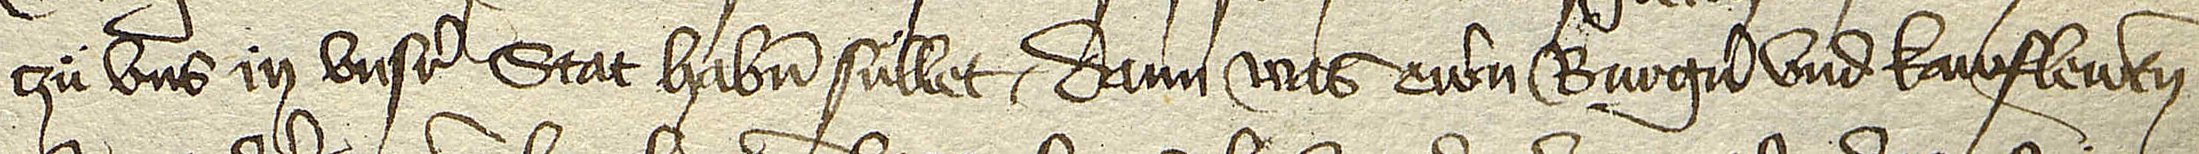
cʒü vns in vnſr* Stat habn* ſüllet / Dann was ew*n Burgn* vnd kawflewtn*
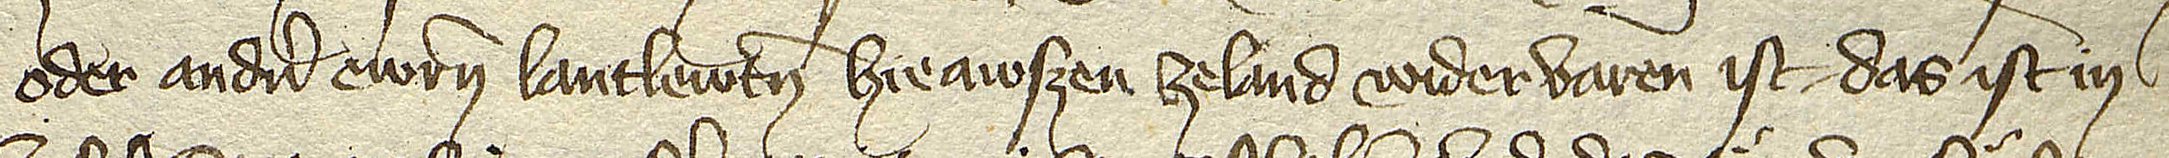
oder andn* ewrn* lantlewtn* hie awſʒen cʒeland widervaren iſt / das iſt in
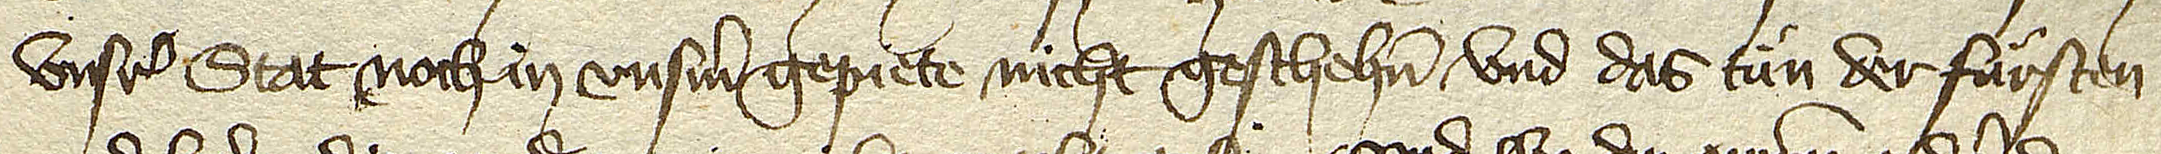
vnſr* Stat noch in vnſm* gepiete nicht geſchehn* / vnd das tün der fürſten
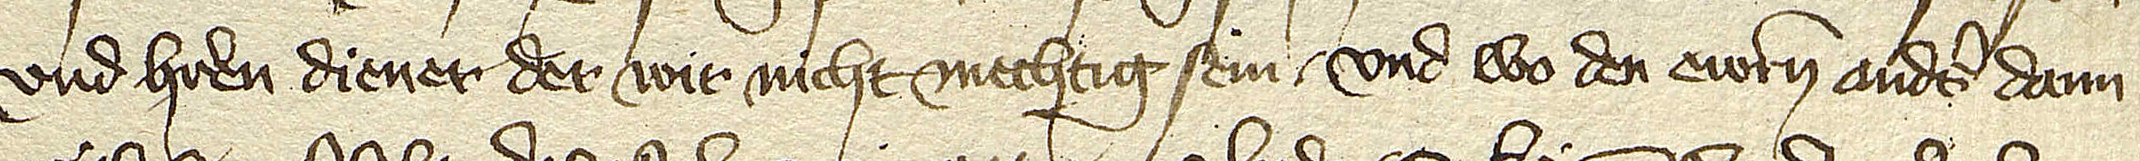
vnd hr*ren dieser der wir nicht mechtig ſein / vnd wo den ew*rn ands* dann
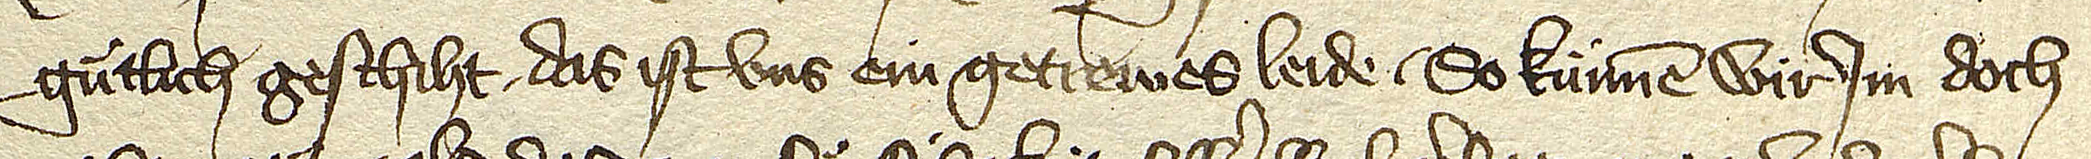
gütlich geſchiht / das iſt vns ein getrewes leide / So künne* wir Im doch
